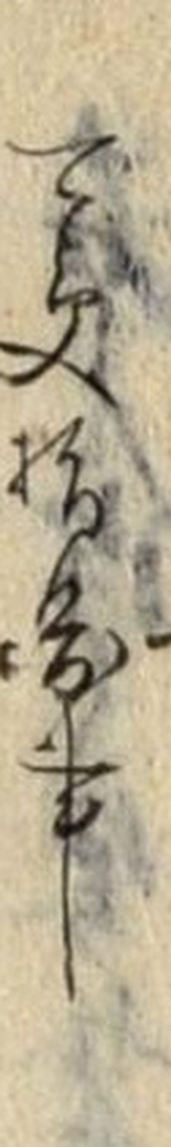可受指図事
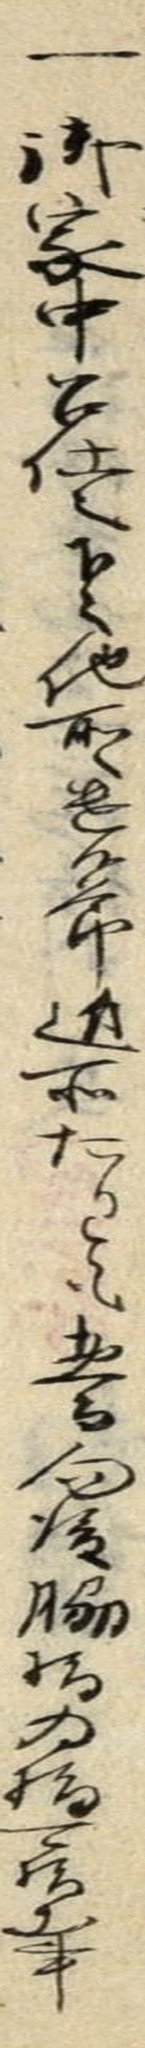一御家中召仕之下々他所へ遣候節近所たりとも惣て向後脇差為指可指出事
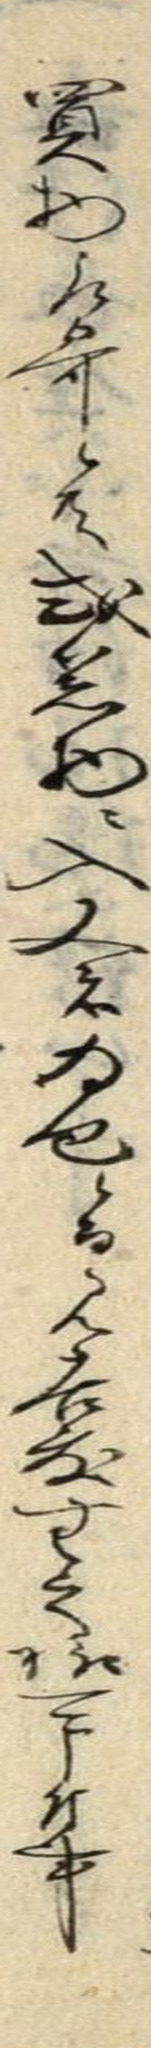買物取寄候共或は器物に入又は為包候て見苦敷無之様可申付事
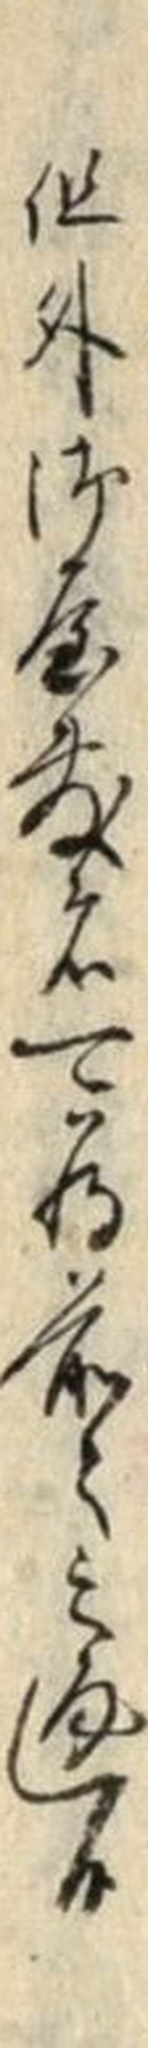但外御屋敷は可為前々之通候
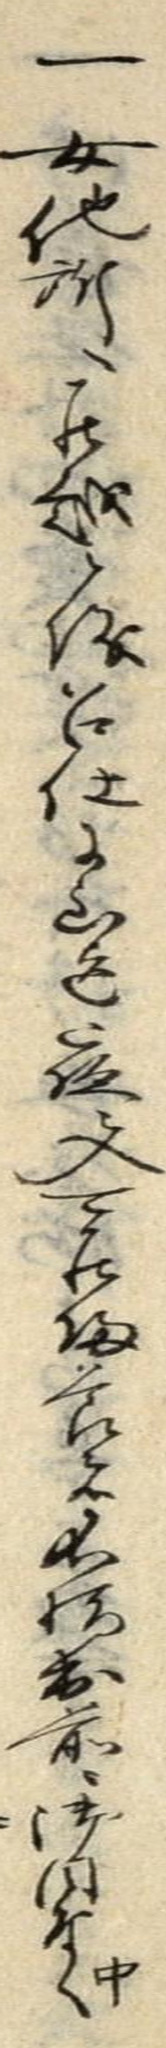一女他所へ罷越候儀召仕に至迄夜に入罷帰節は不指出前々御目付中へ

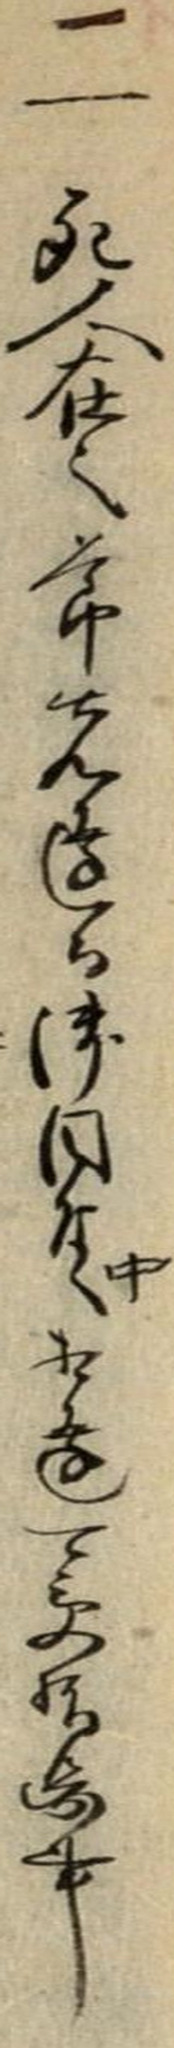一死人在之節先達て御目付中へ相達可受指図事
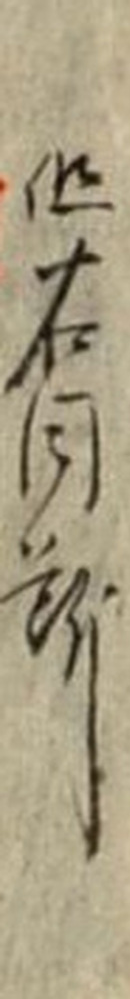但右同断
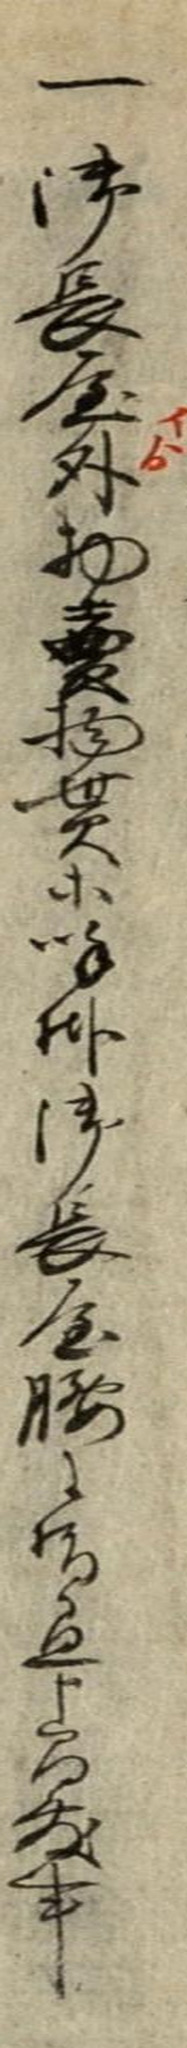一御長屋外物売物貰等呼掛御長屋腰に指置申間敷事
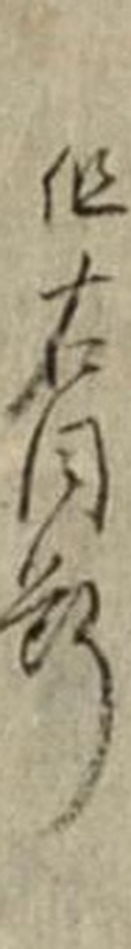但右同断
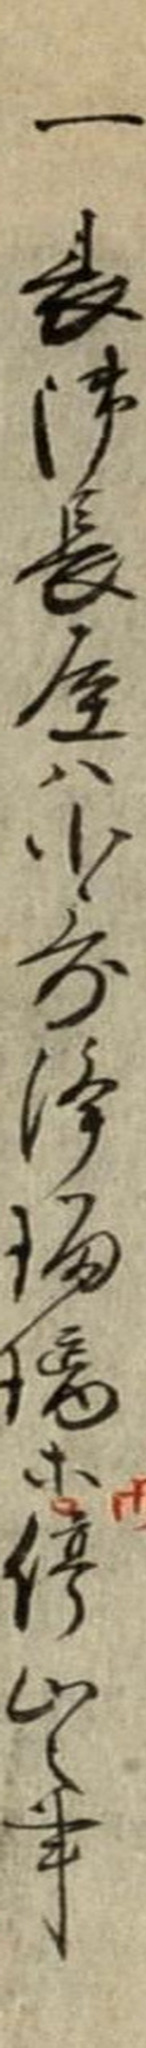一表御長屋は小哥浄瑠璃等停止之事
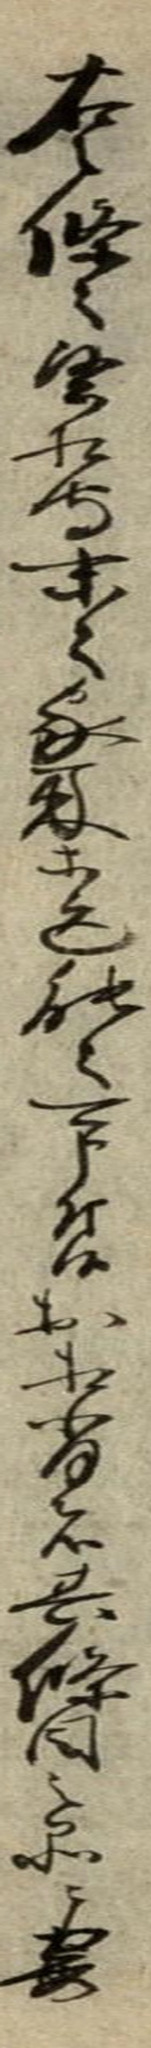右之條々堅相守末々家来等迄能々可申付候於相背は其條目之品に寄
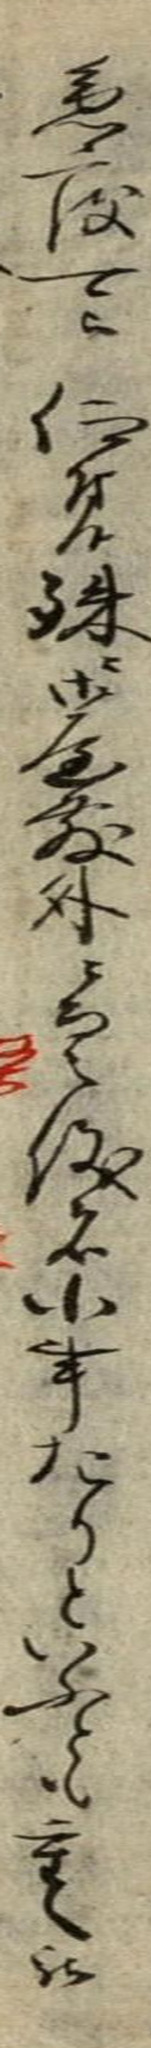急度可被仰付候殊に御屋敷外にて之儀は小事たりといふとも重々被
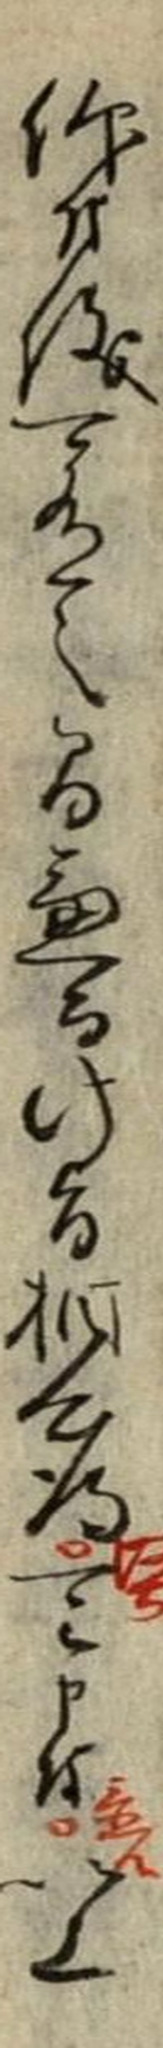仰付儀可有之間兼て此旨相心得可被申付以上
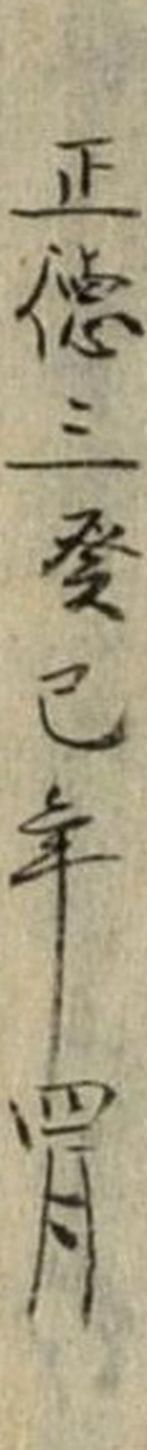正徳三癸巳年四月
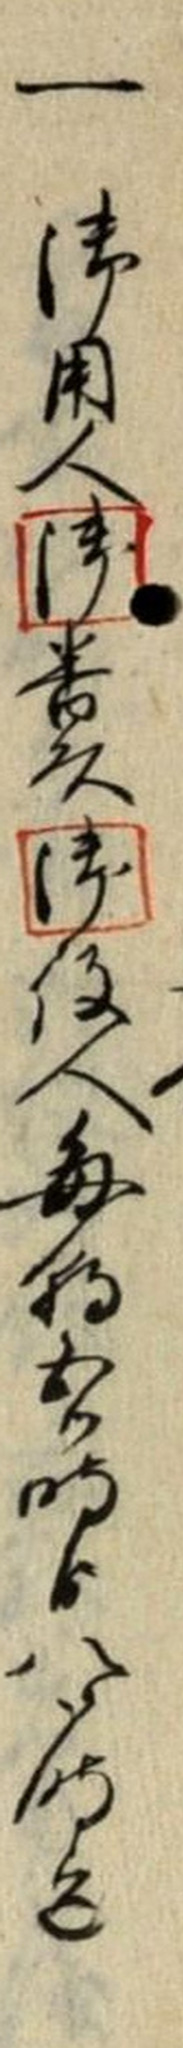一御用人御番頭御役人毎朝五ツ時ゟ八ツ時迄
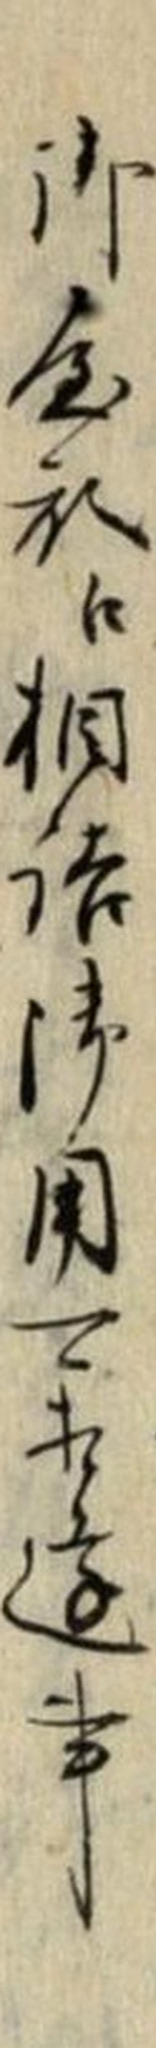御屋形江相詰御用可相達
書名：三都并道中之部
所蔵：福井県文書館 Fukui Prefectural Archives
